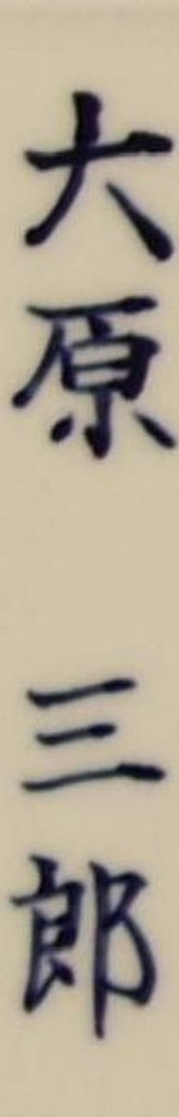大原三郎
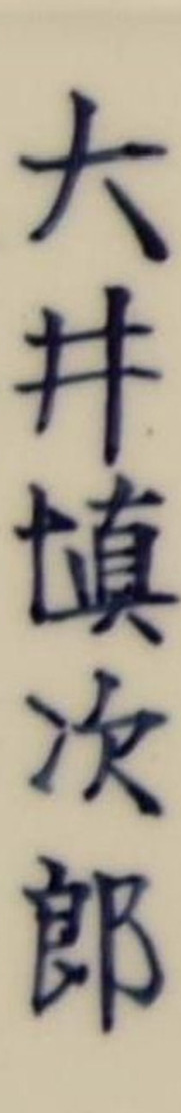大井慎次郎
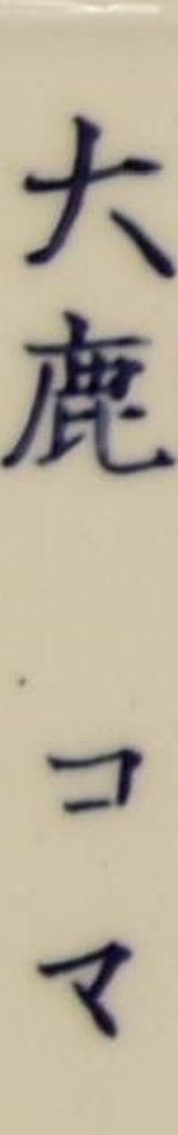大鹿コマ
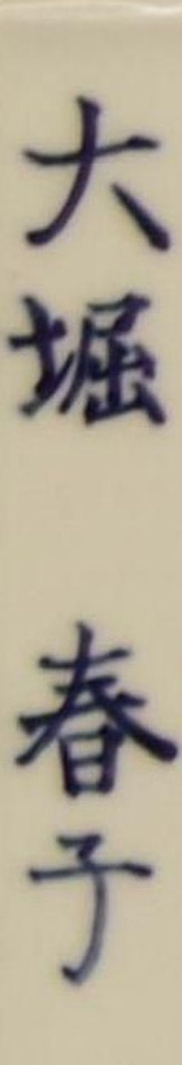大堀春子

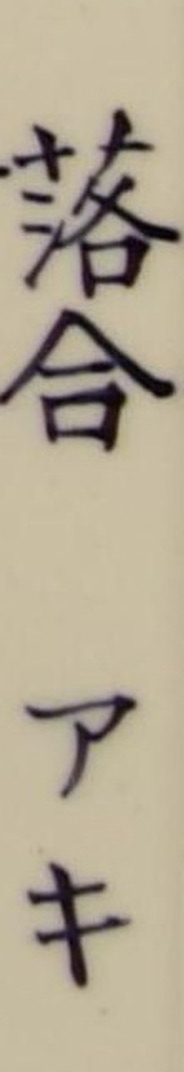落合アキ
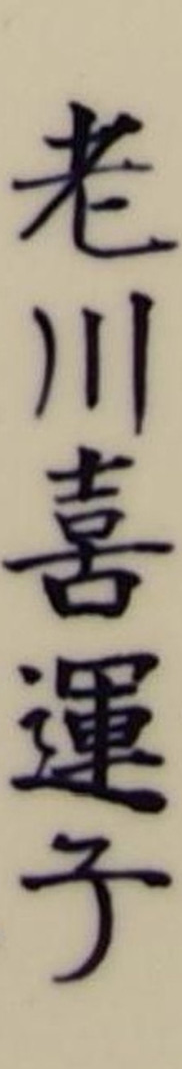老川喜運子
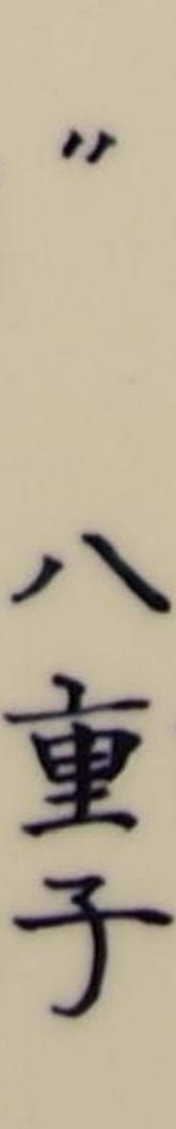八重子
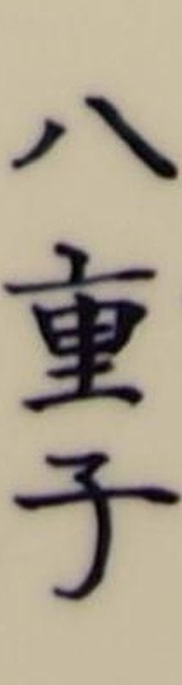八重子
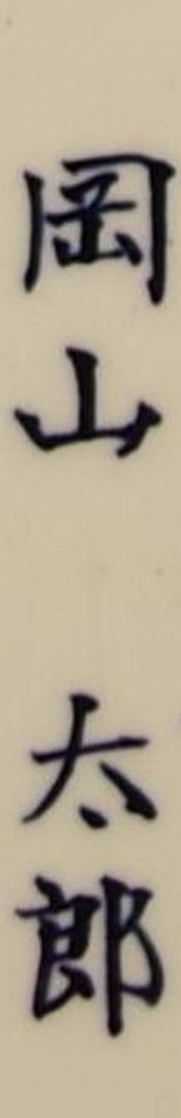岡山太郎
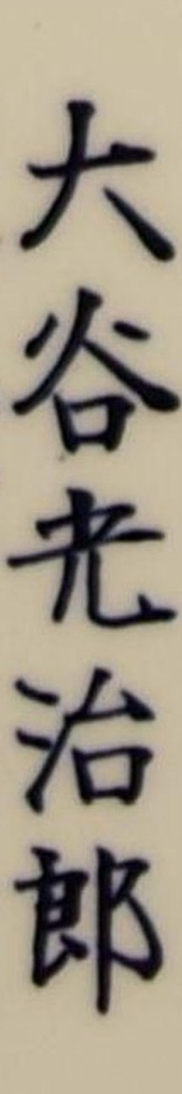大谷光治郎
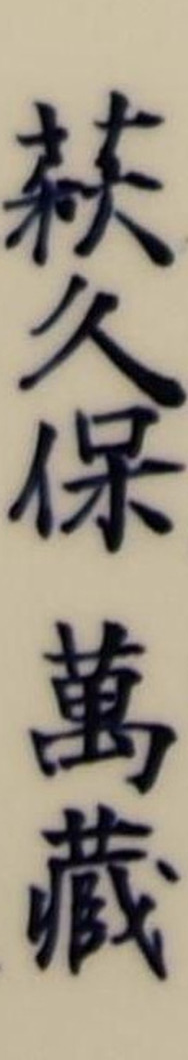萩久保万蔵
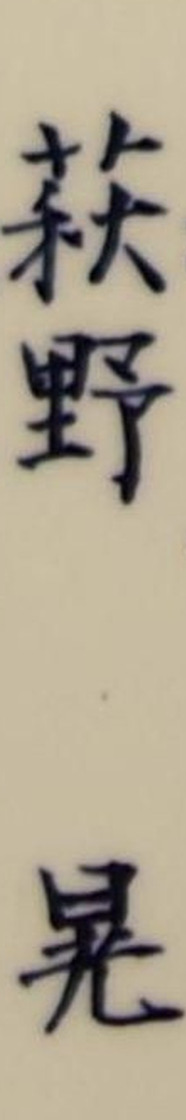萩野晃
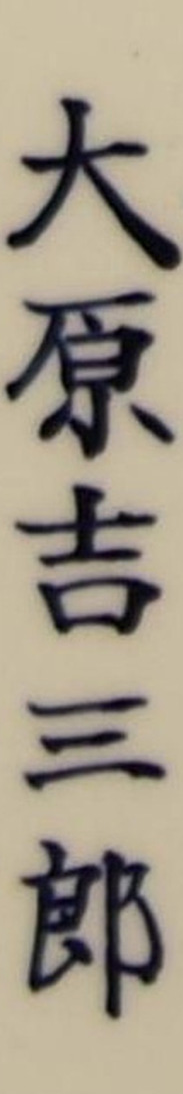大原吉三郎
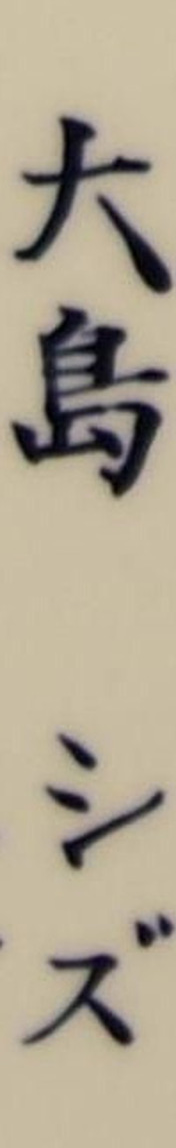大島シズ
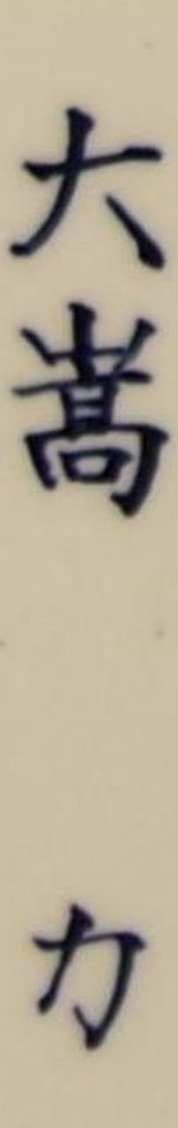大嵩力
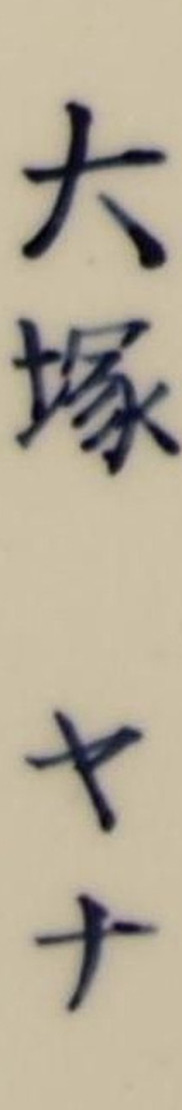大塚ヤナ
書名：A~D
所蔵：koyasan kongobuji
